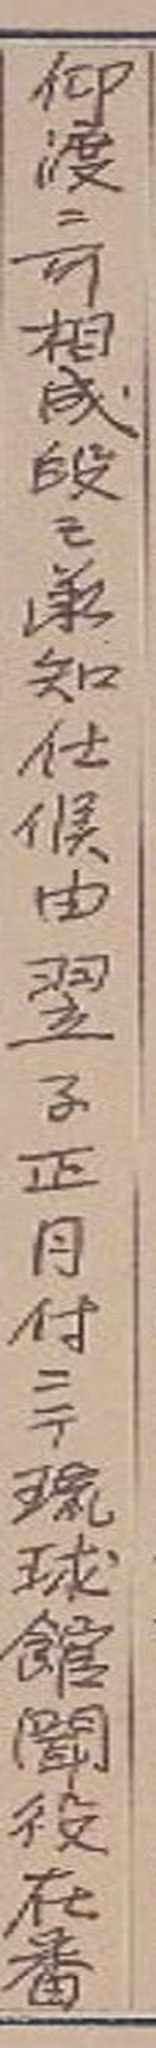仰渡に可相成段も承知仕候由翌子正月付にて琉球館聞役在番
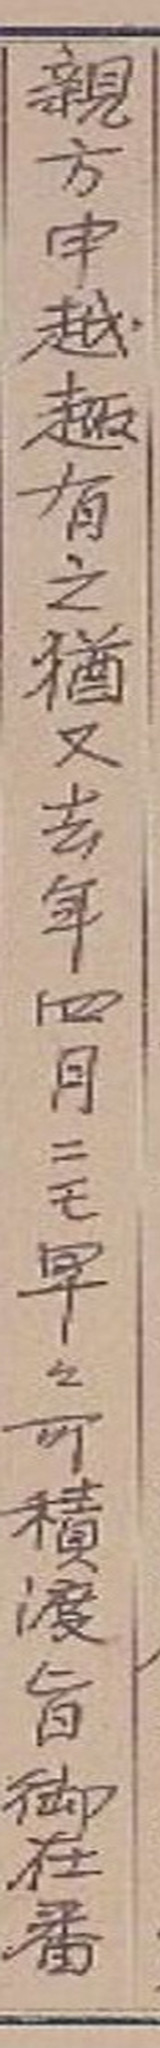親方申越趣有之猶又去年四月にも早々可積渡旨御在番
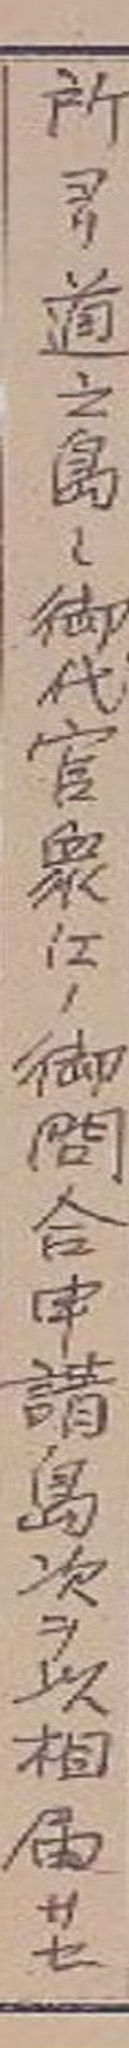所より道之島之御代官衆えの御問合申請島次を以相届させ

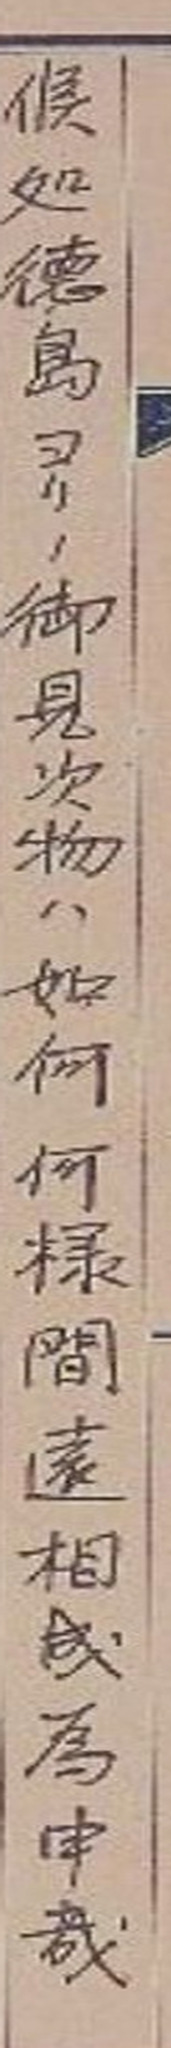候処徳島よりの御見次物は如何何様間遠相成為申哉
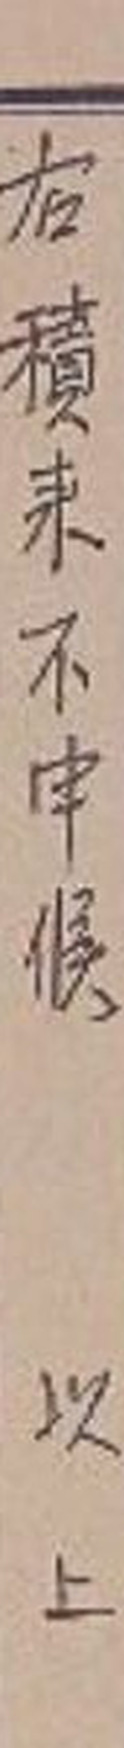右積来不申候以上
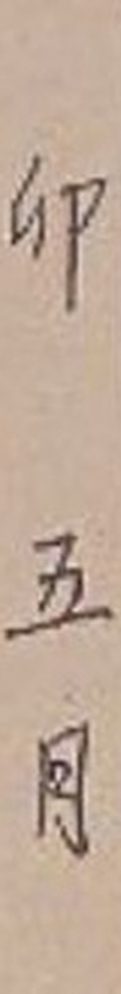卯五月
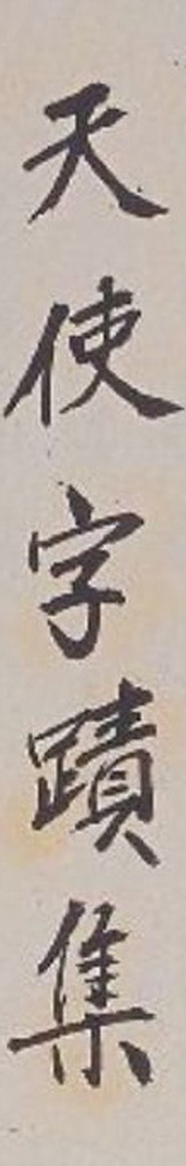天使字蹟集

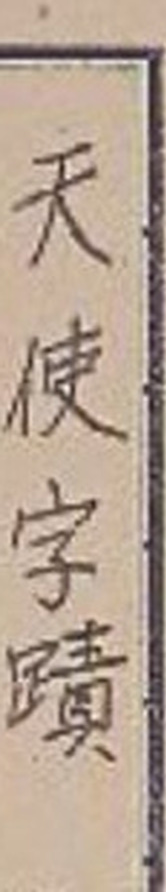天使字蹟
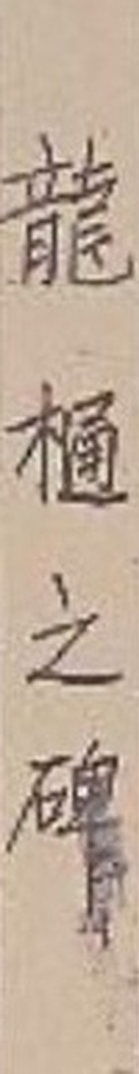龍樋之碑
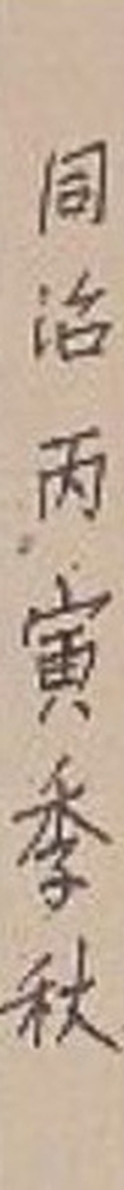同治丙寅季秋
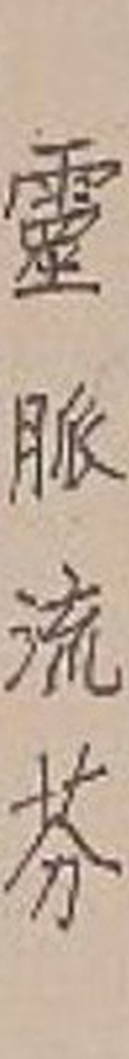霊脈流芬
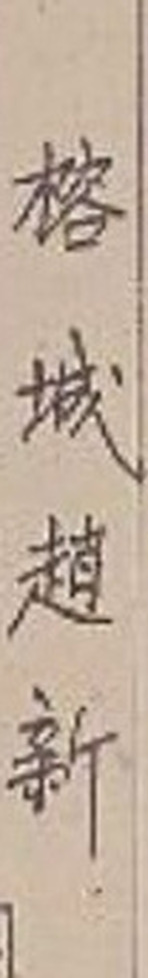榕城趙新
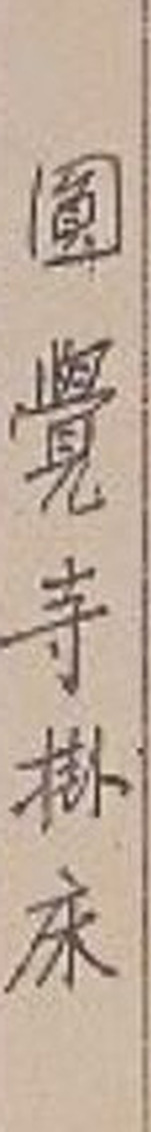円覚寺掛床
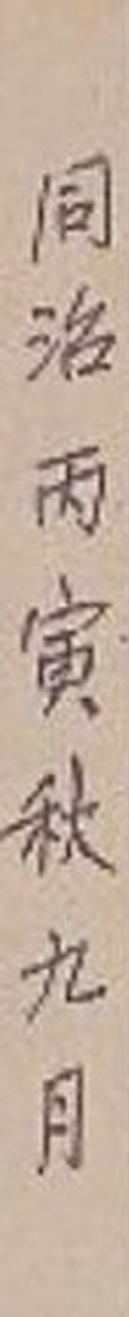同治丙寅秋九月
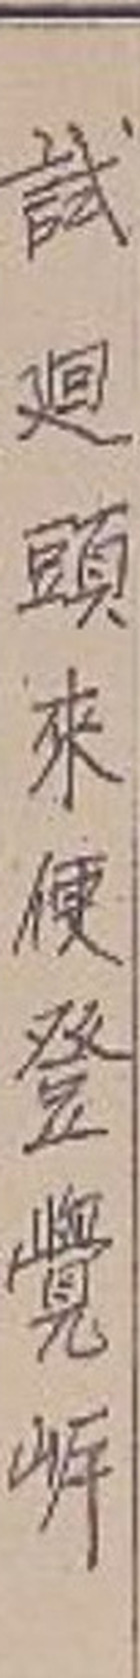試廻頭来便登覚岸
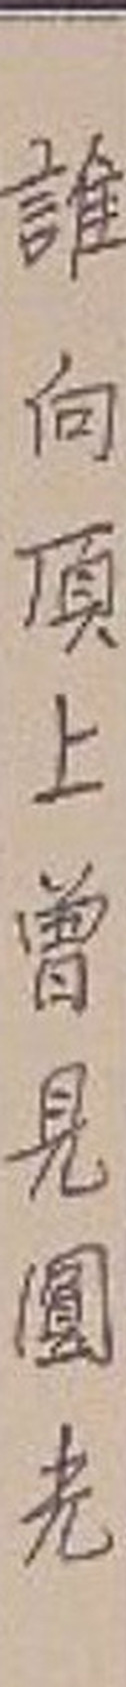誰向頂上曽見円光
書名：支那冊封使来琉諸記 下巻
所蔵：University of the Ryukyus Library
